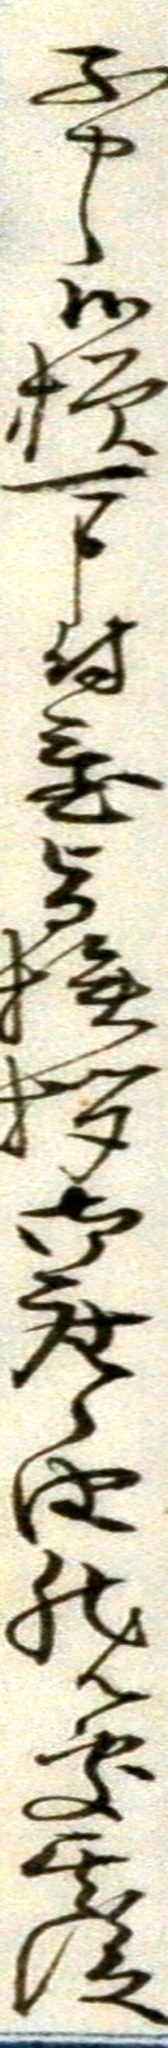不申候様可申付置旨挨拶御座候由然ル處其後

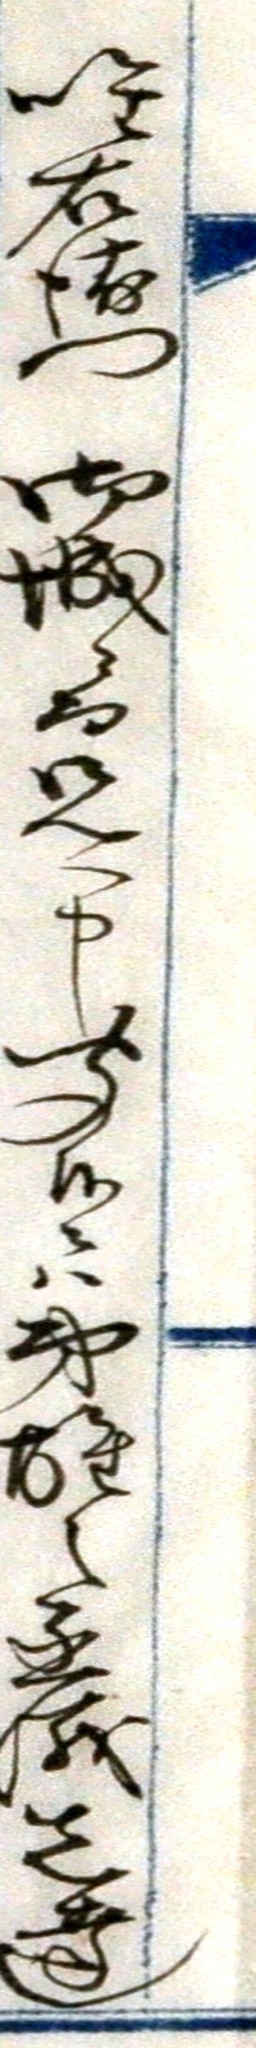唯右衛門御城ニ而兄へ申聞候ニハ弟雄之丞儀先達
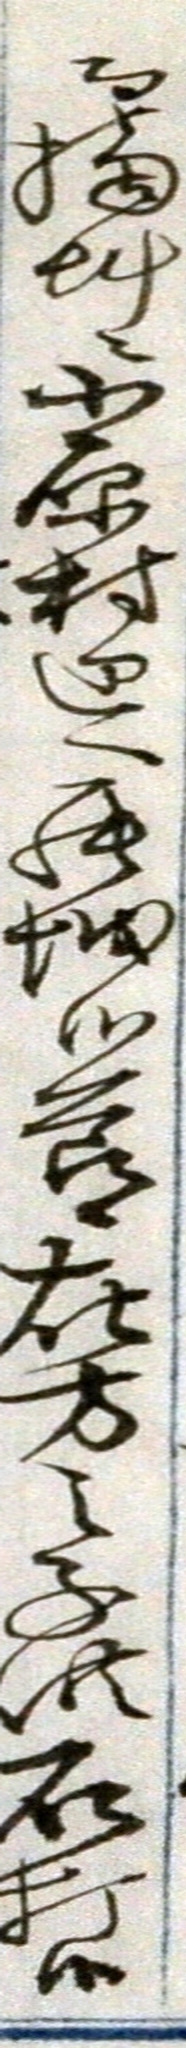而摘草ニ小原村辺へ罷越候節在方之子供石打候
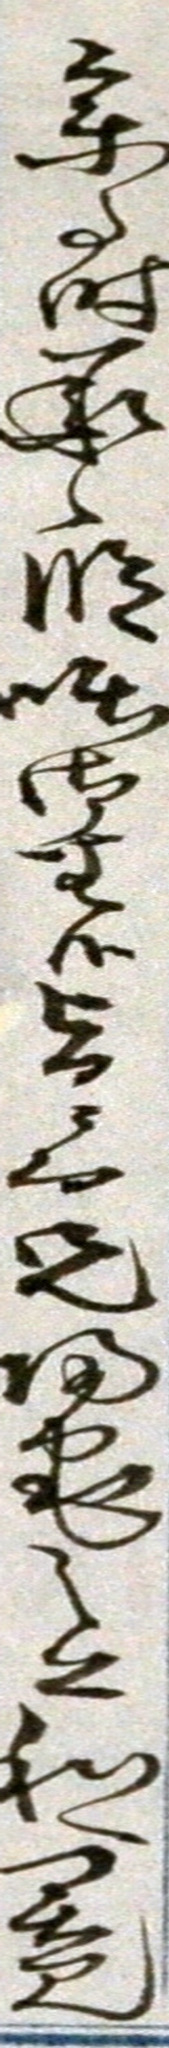参る時承候段咄御座候旨ニ而兄帰宅之上私へ異見
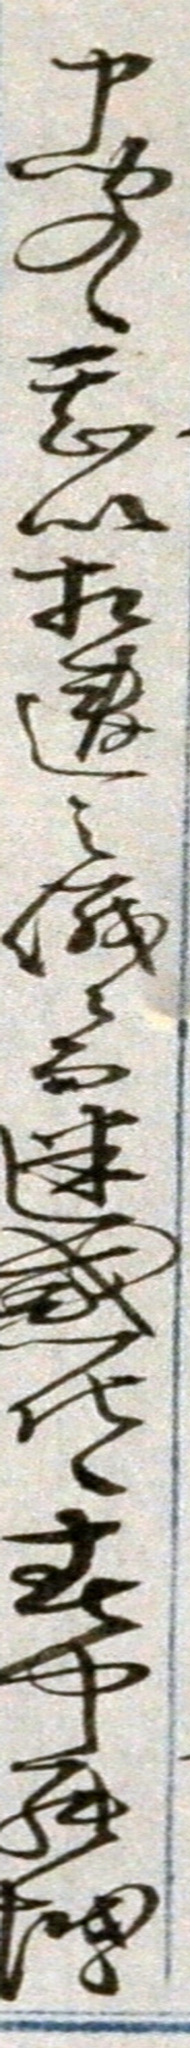申聞候甚以相違之儀ニ而迷惑仕候春中罷越候
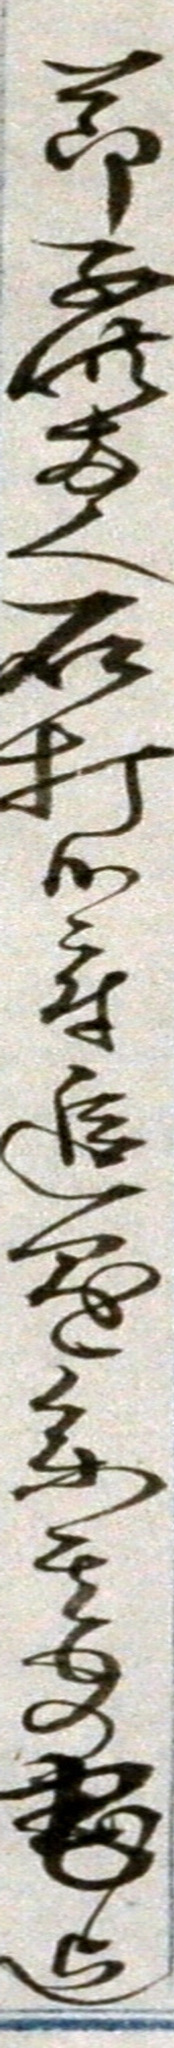節子供両人石打候ニ付追懸参其者宅迄
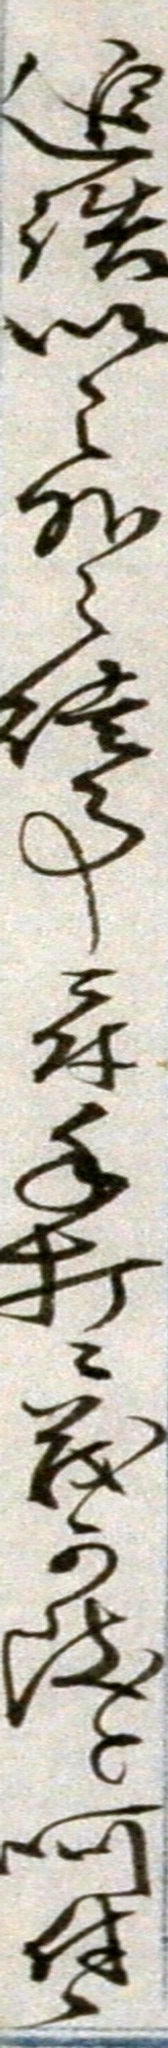追詰以之外之徒事ニ付手打ニ茂可致と呵付候
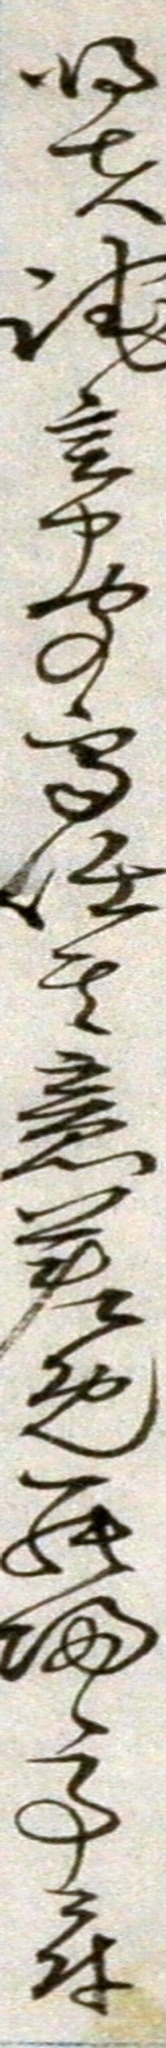得者詫言申聞候間任其意差免罷帰候事ニ付
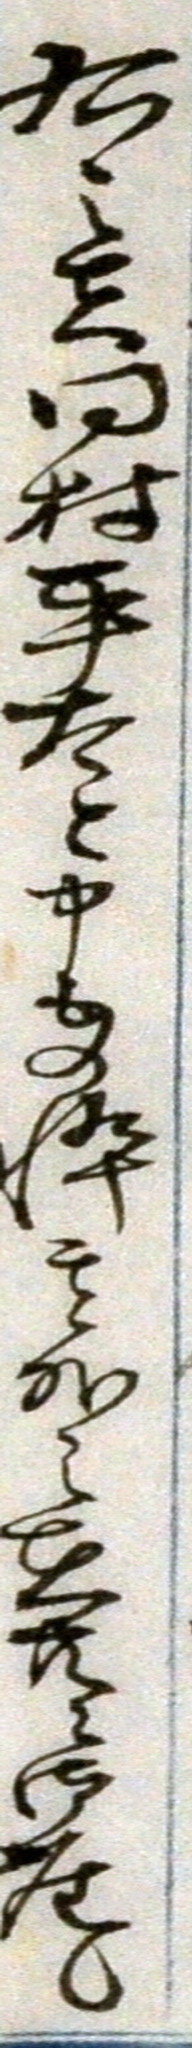右之者同村平太と申もの忰其外之者共ニ御座候
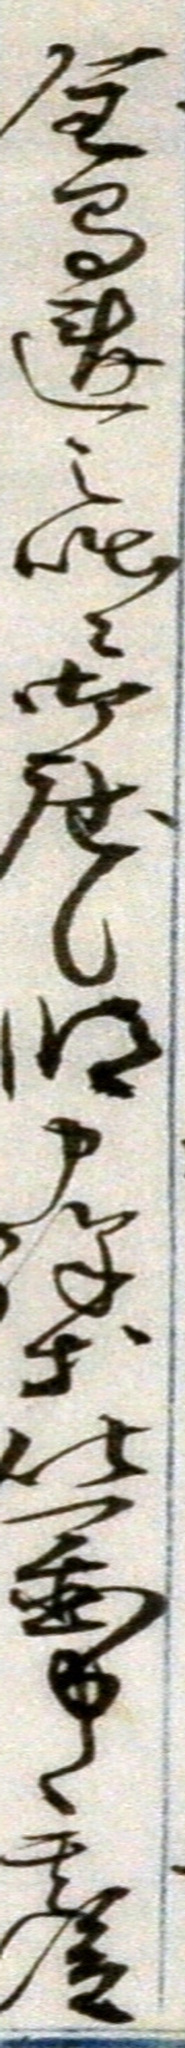全間違之咄ニ御座候段申訳抔仕置申候其後
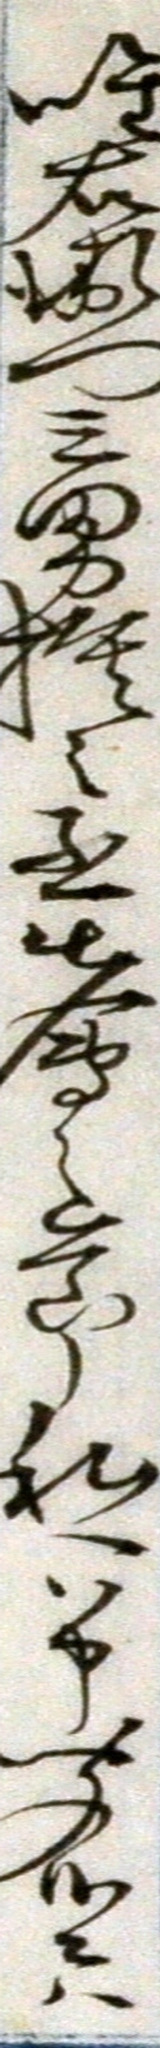唯右衛門三男権之丞出会之節私へハ申聞ニハ
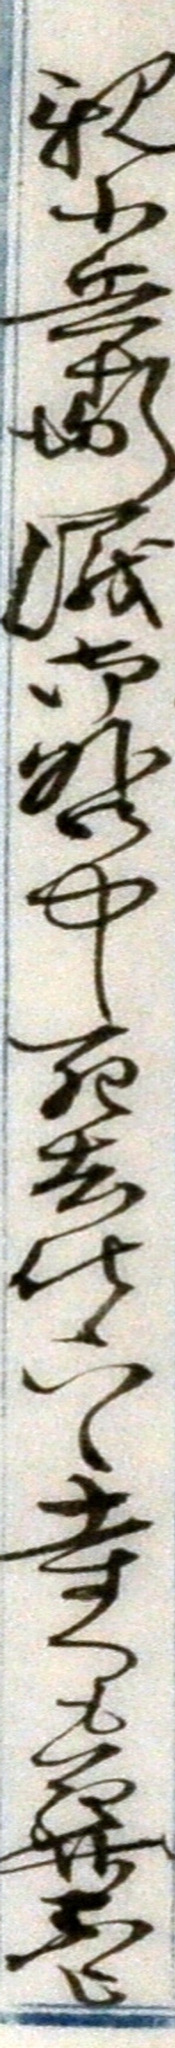親小兵衛儀御咎中死去仕候ハヽ寺へも葬不被
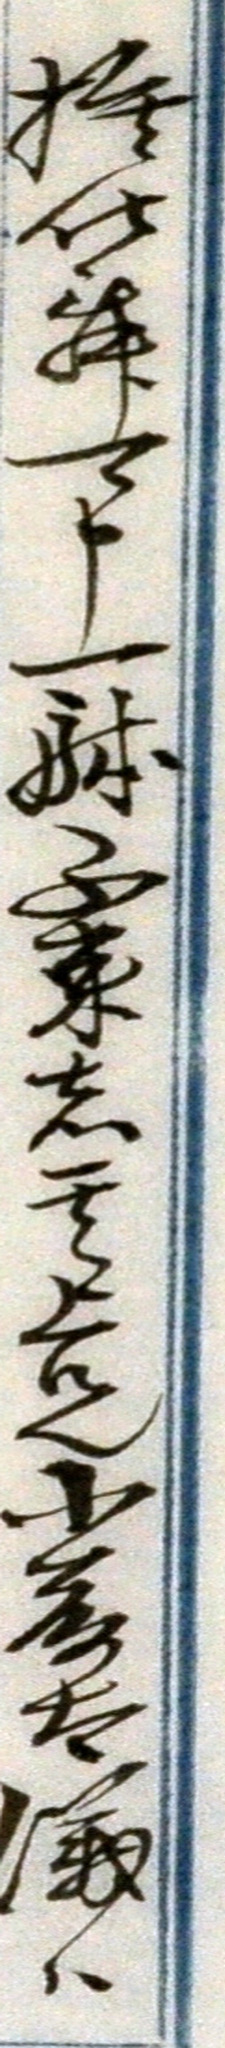捨仕舞可申一体不束者其上兄小藤太儀ハ
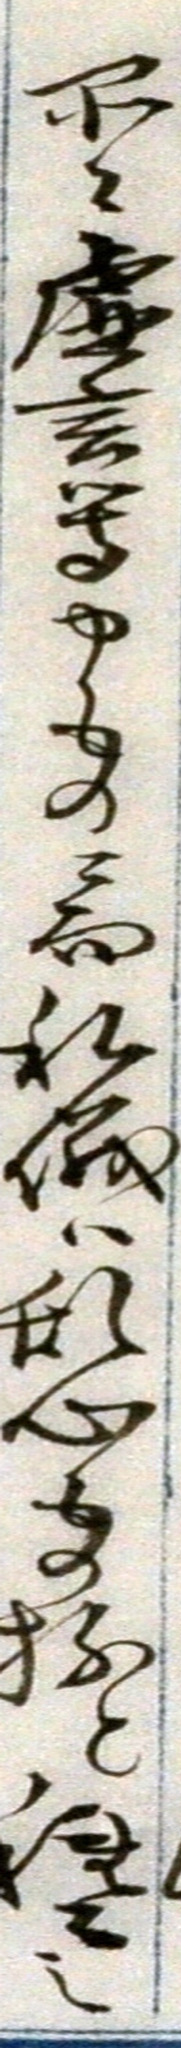品々虚言等申す者ニ而私儀ハ乱心者抔と種々之
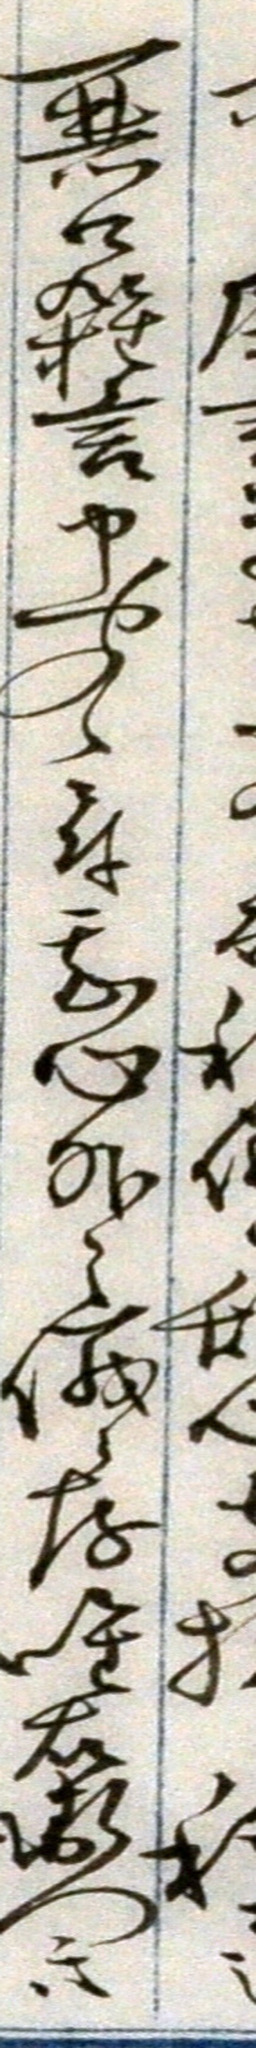悪口雑言申聞候ニ付甚心外之儀ニ存唯右衛門ニハ
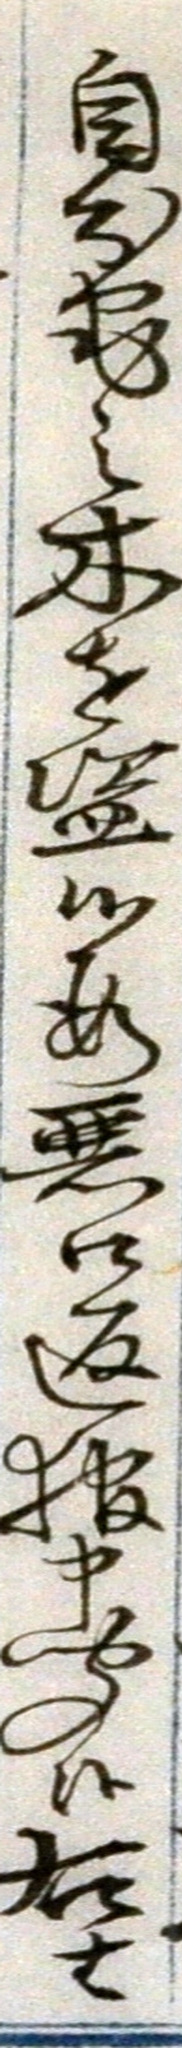自分宅之木を盗候段悪口返報申聞候右者
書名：川面小藤太子細有之多賀谷唯右衛門ヲ打果候一件
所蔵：伊那市立高遠町図書館・合同会社AMANE
